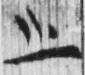之
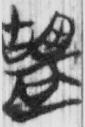○（盬）
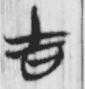吉
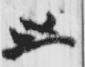之
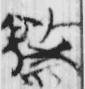○（敓）
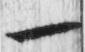一
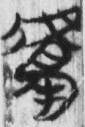膚
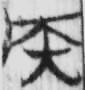矦（后）
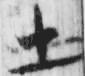土
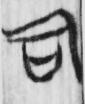司
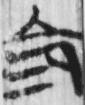命
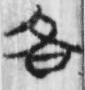各
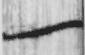一
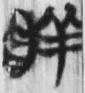牂
